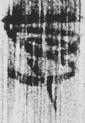𠭁
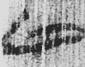㠯
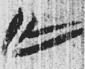亡
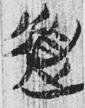道
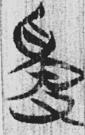爯（稱）
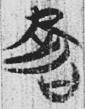害（曷）
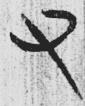又（有）
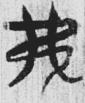弗
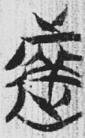○（失）
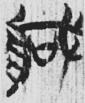○（莊）
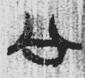公
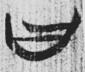曰
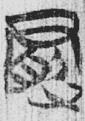曼
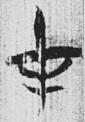才（哉）
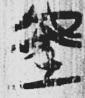○（吾）
